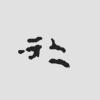亓（其）
